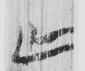亡
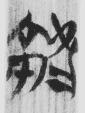{京欠}
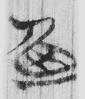廼
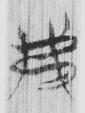弗
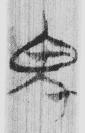畏
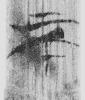不
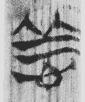恙
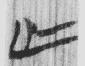亡
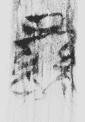㬎
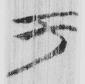于
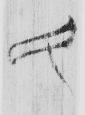民
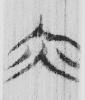亦
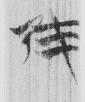隹
